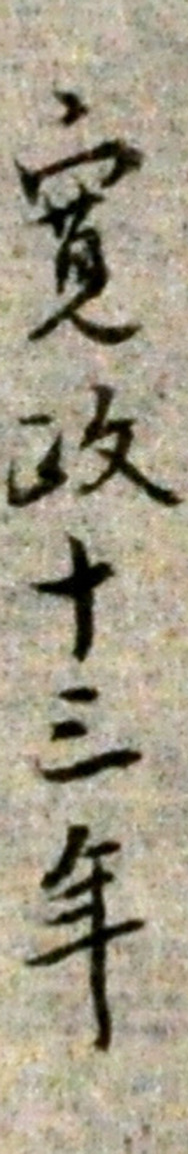寛政十三年
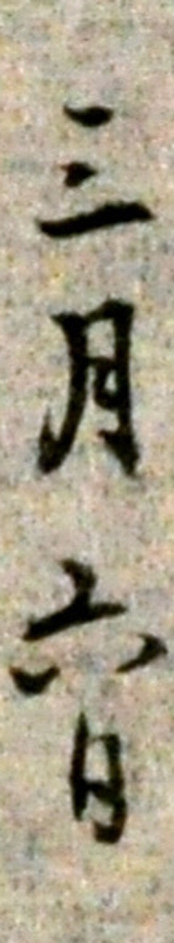三月六日
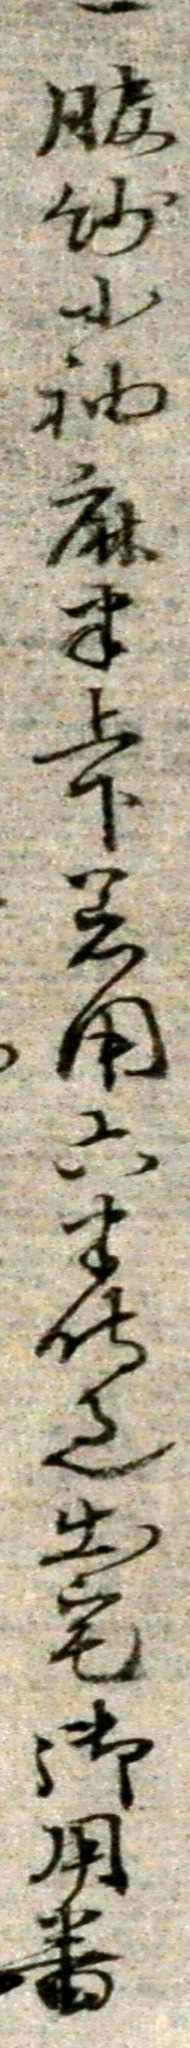一服紗小袖麻半上下着用六半時過出宅御用番
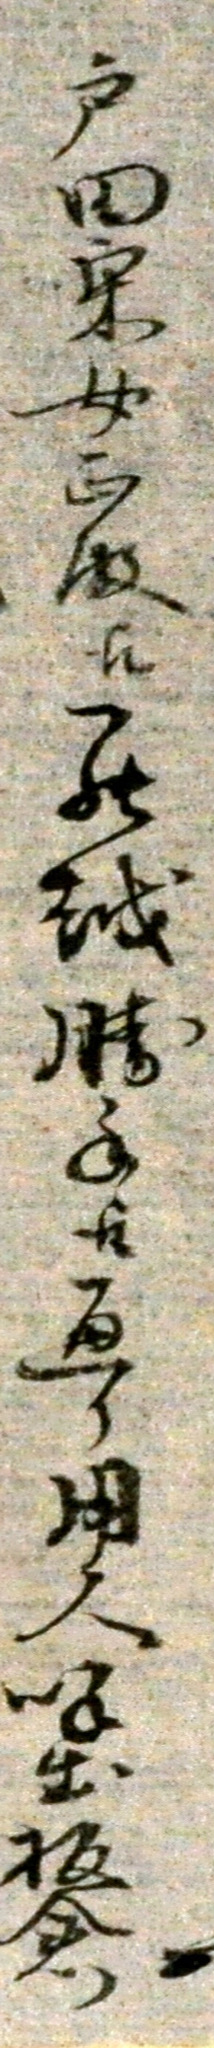戸田采女正殿え罷越勝手え通り用人呼出板倉
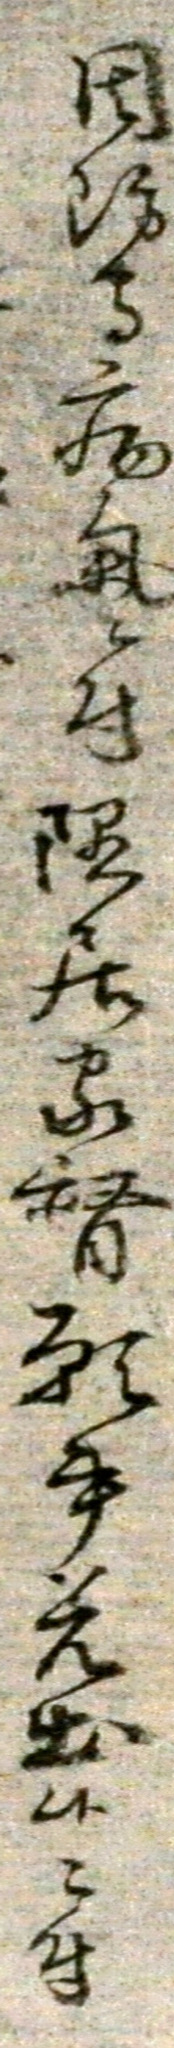周防守病気ニ付隠居家督願書差出候ニ付
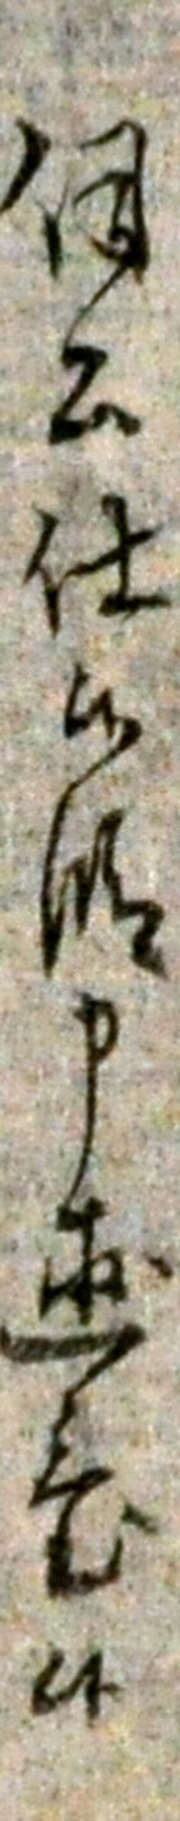伺公仕候段申述置候
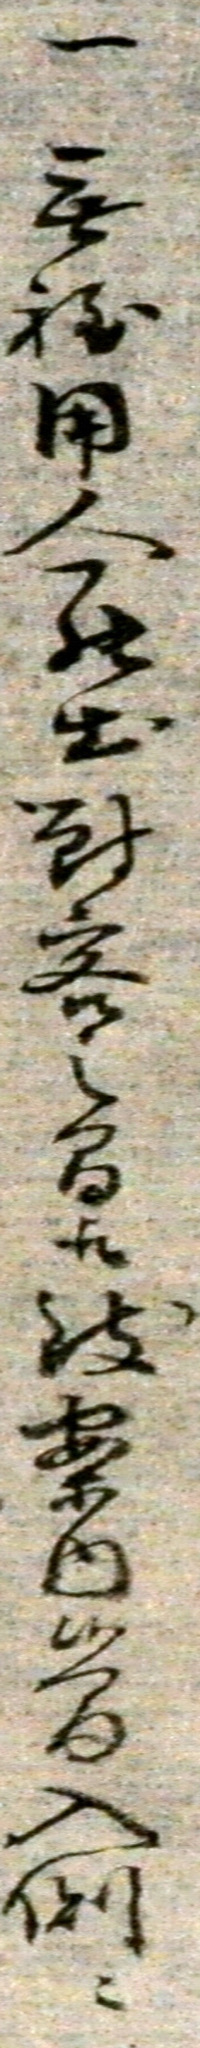一無程用人罷出対客之間え致案内候間入側ニ
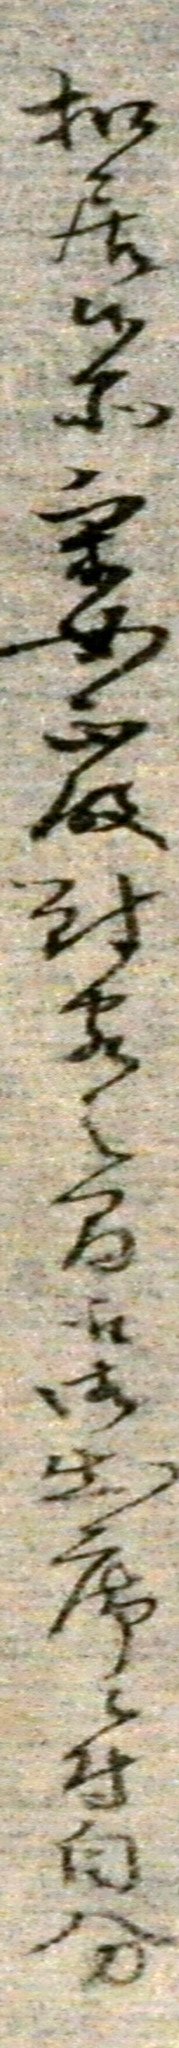扣居候所采女正殿対客之間え御出席ニ付自分
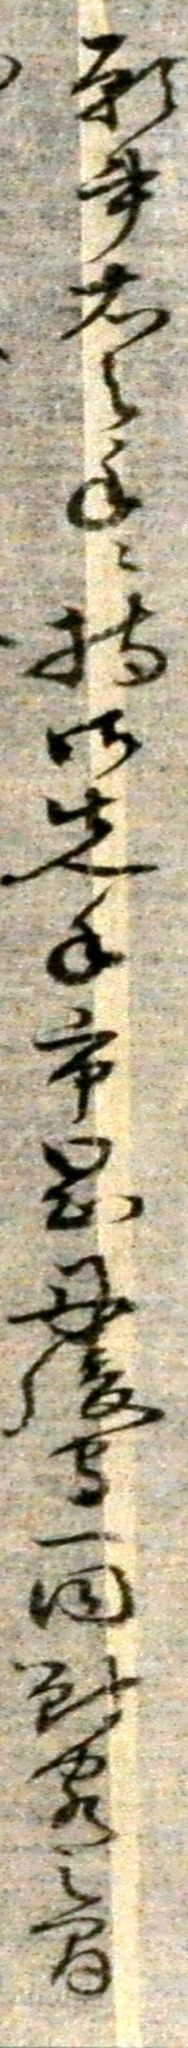願書右之手ニ持御先手市岡丹後守一同対客之間
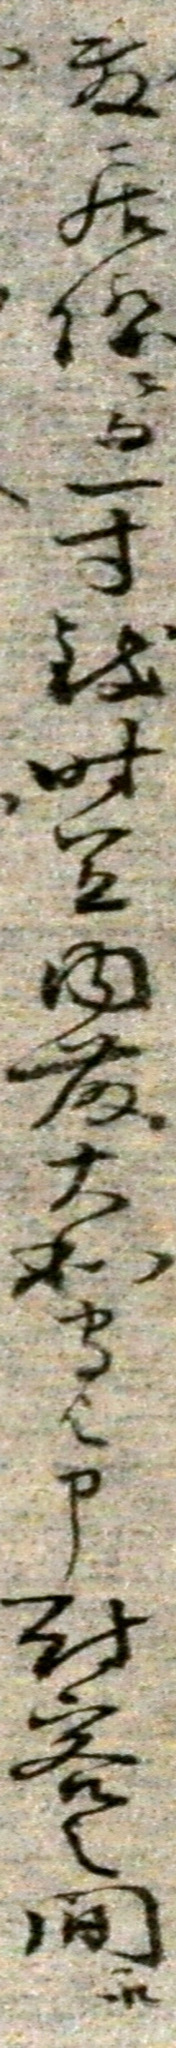敷居際ニ而一寸致時宜内藤大和守と申対客之間え
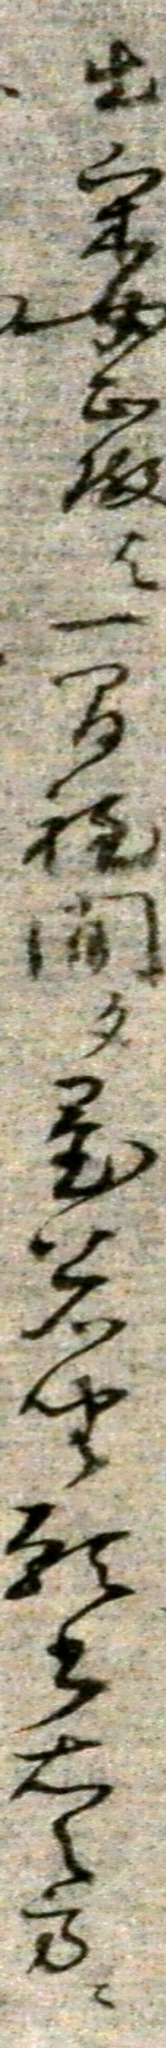出采女正殿と一間程間タ置着坐願書右之方ニ
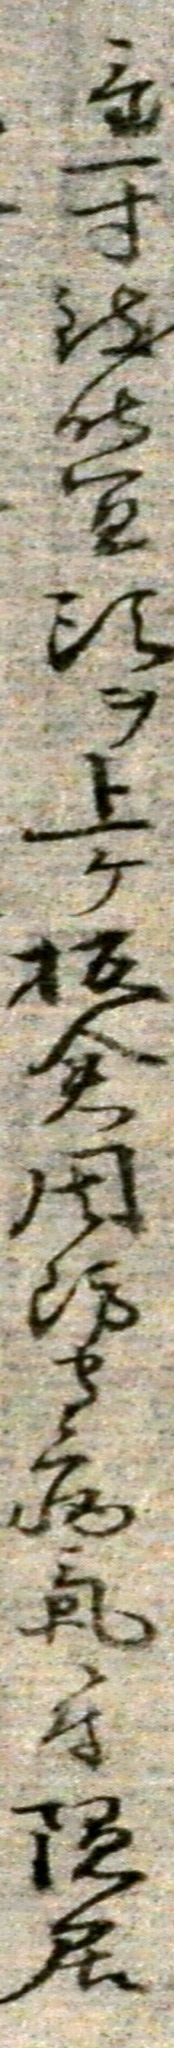置一寸致時宜頭ヲ上ケ板倉周防守病気ニ付隠居
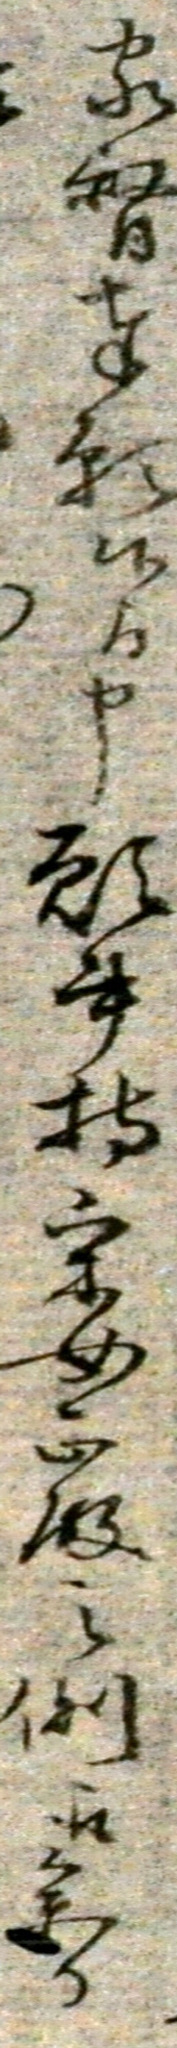家督奉願候旨申願書持采女正殿之側え参り
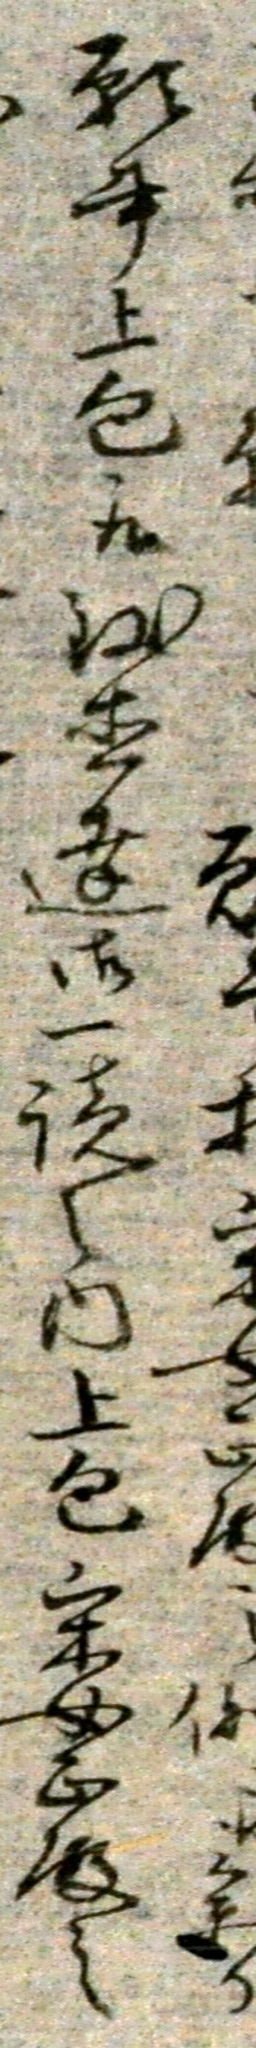願書上包取致直達御一読之内上包采女正殿之
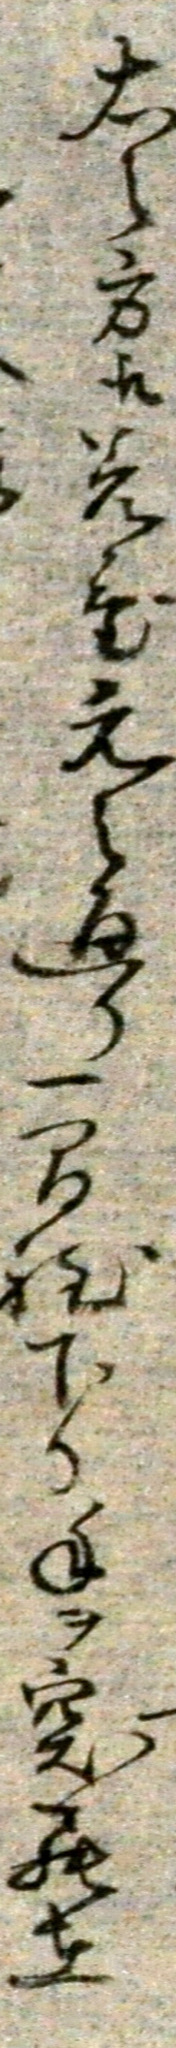右之方え差置元之通り一間程下り手ヲ突罷在
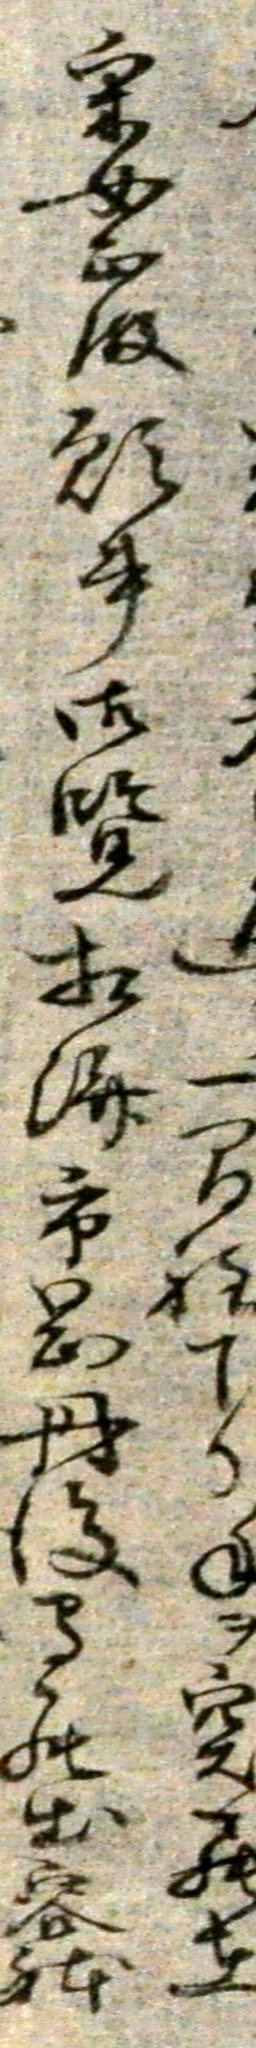采女正殿願書御覧相済市岡丹後守罷出容躰
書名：諸名代相勤候節ノ留書外
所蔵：伊那市立高遠町図書館・合同会社AMANE
